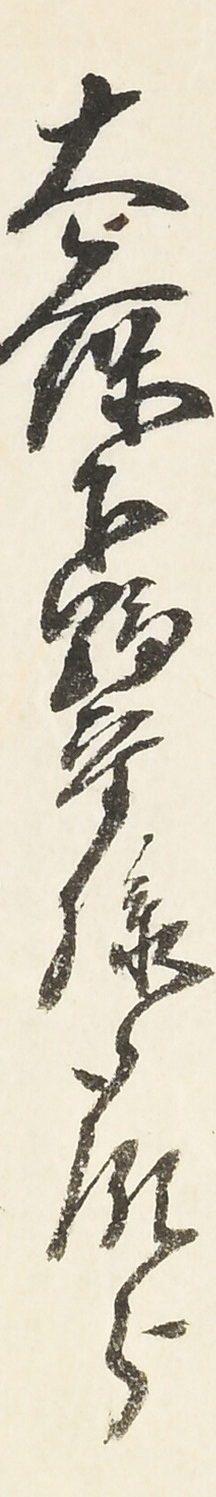大久保下野守様御領分
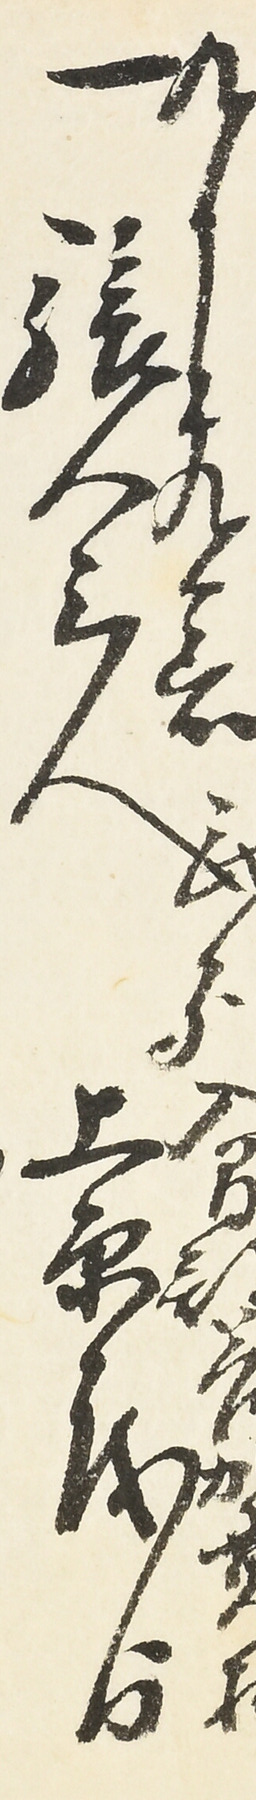一旅人三人上原茂衛門
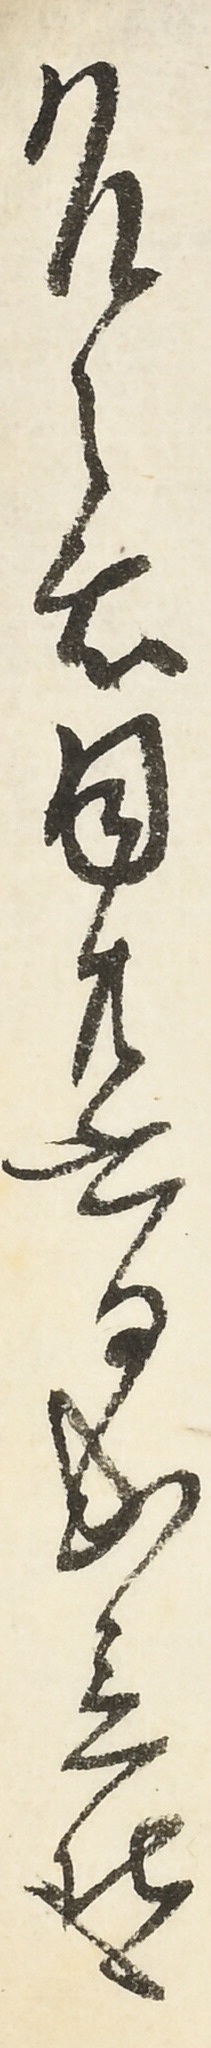右之者同廿六日出立仕候
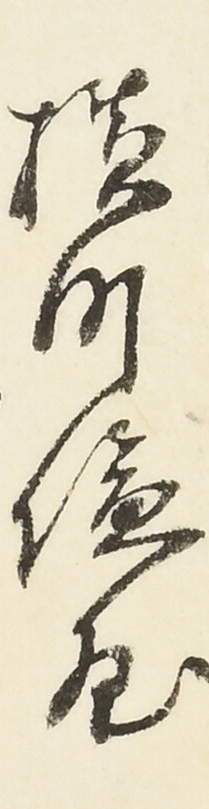横町塩屋

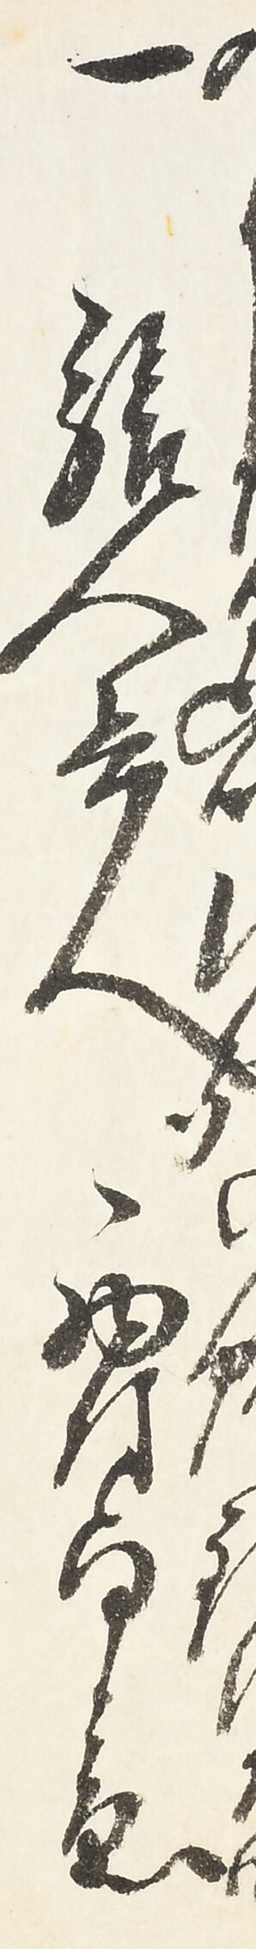一旅人壱人西村与兵衛
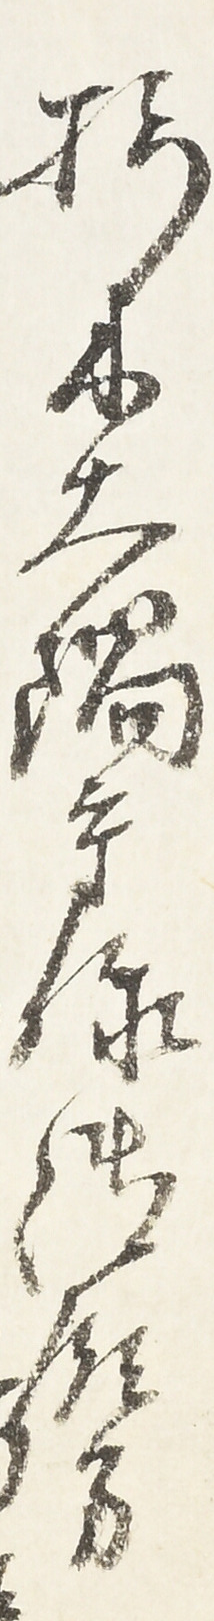朽木大隅守様御領分
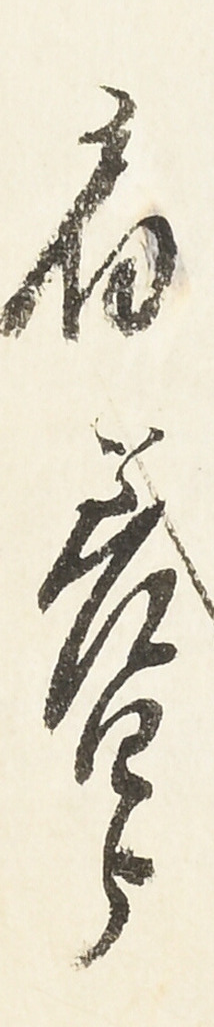宿善四郎
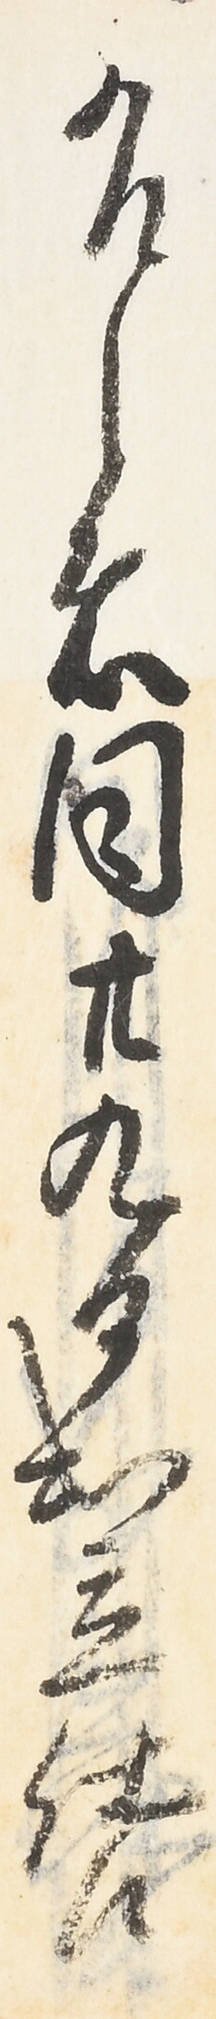右之者同廿九日出立仕候
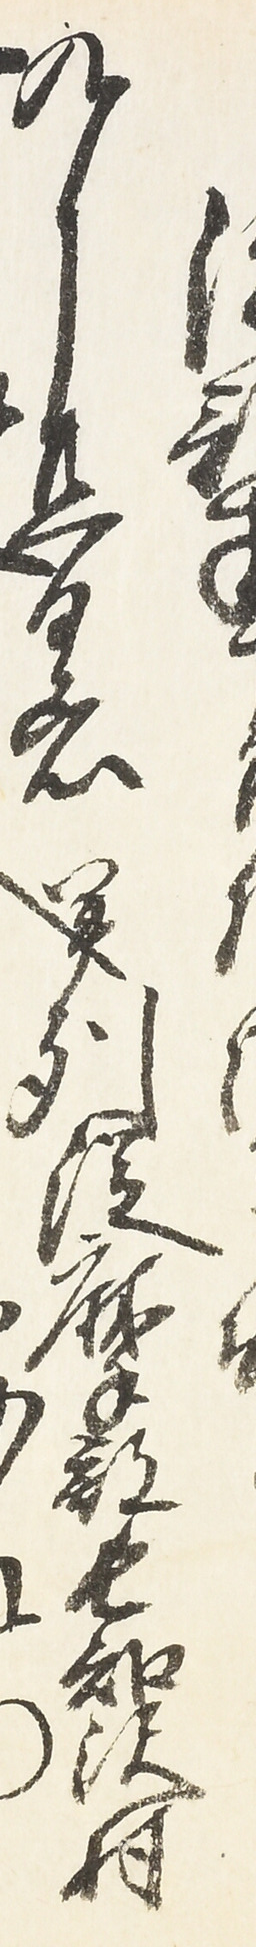九月廿一日着甲州従摩郡長知沢村
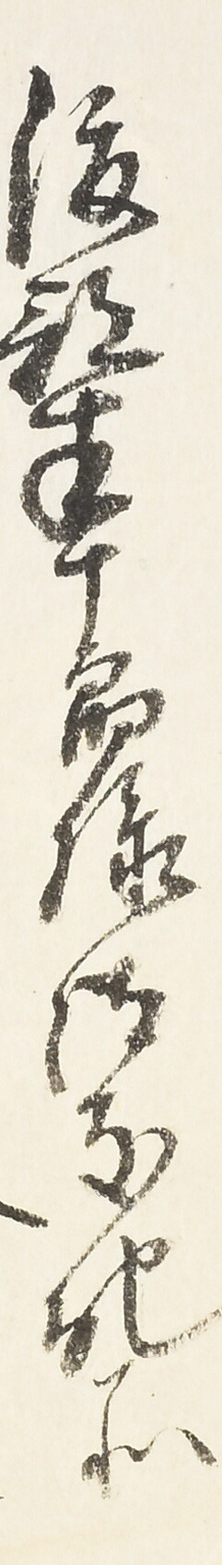渡部半十郎様御支配所
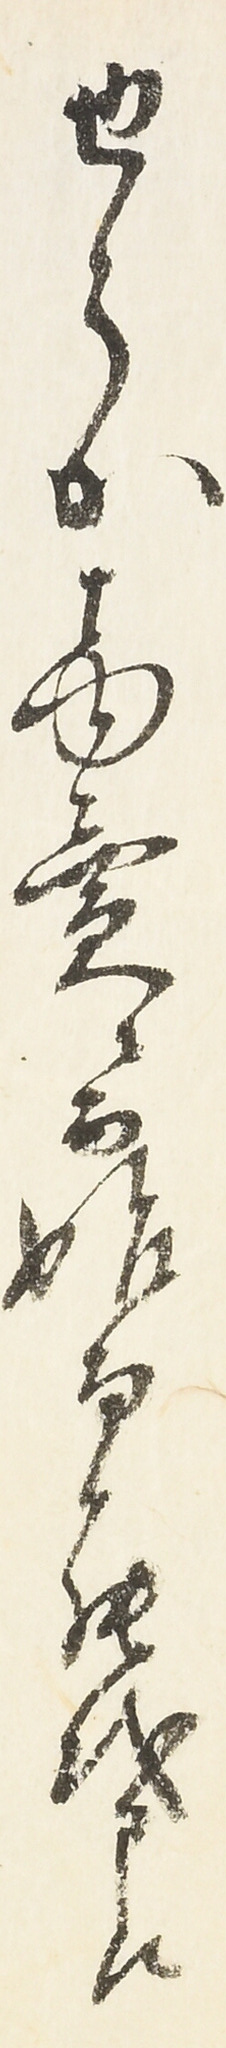せうか商売ニ而始而罷越申候
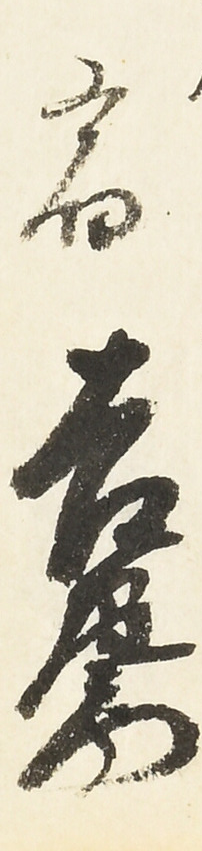宿吉左衛門
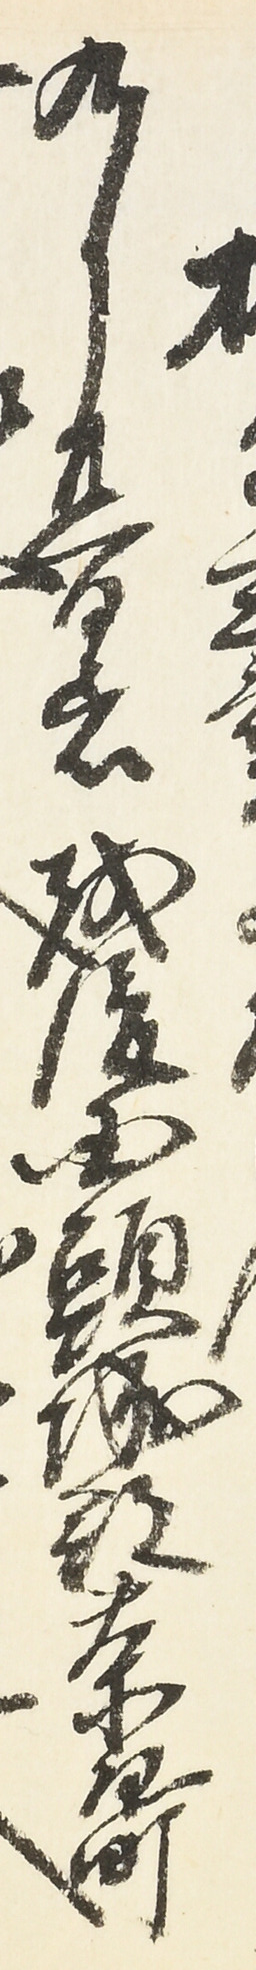九月廿一日着越後国頸城郡茶屋町
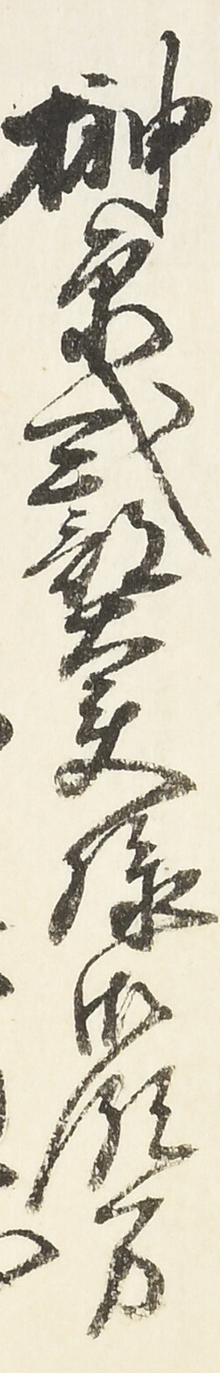榊原式部太夫様御領分
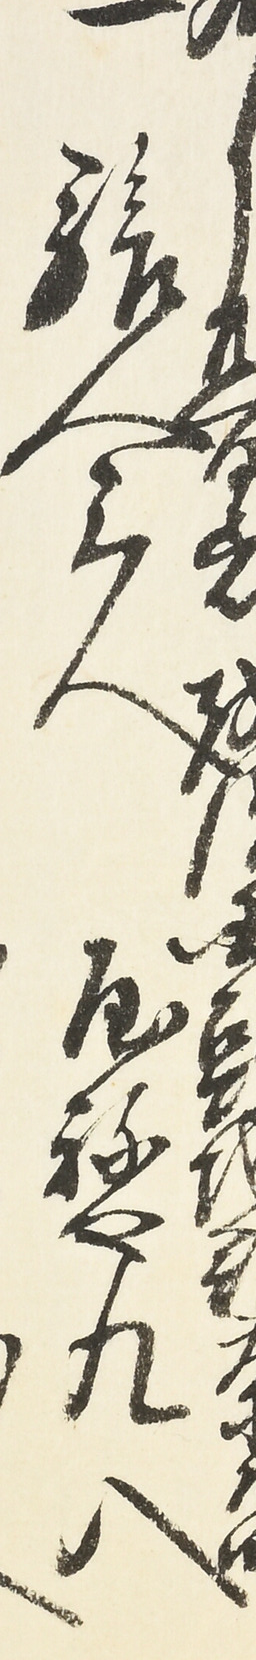一旅人三人屋ねや九八
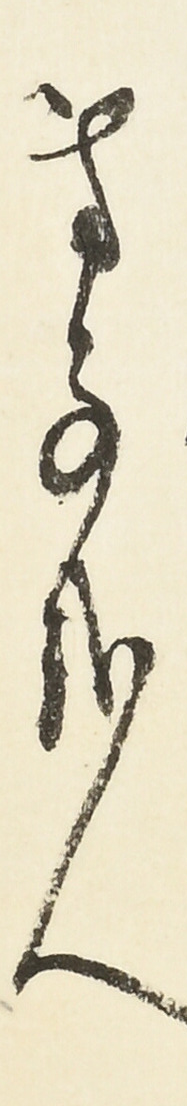弟子弐人
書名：町中旅人泊控帳
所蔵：伊那市立高遠町図書館・合同会社AMANE
